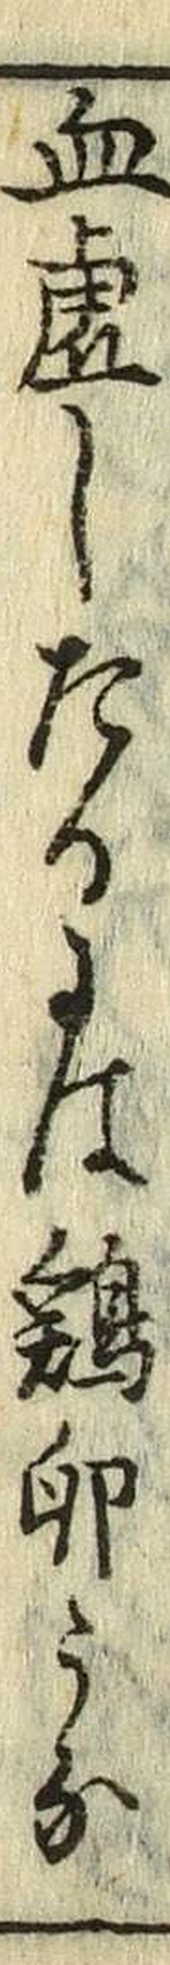血虚したるには鶏卵うな
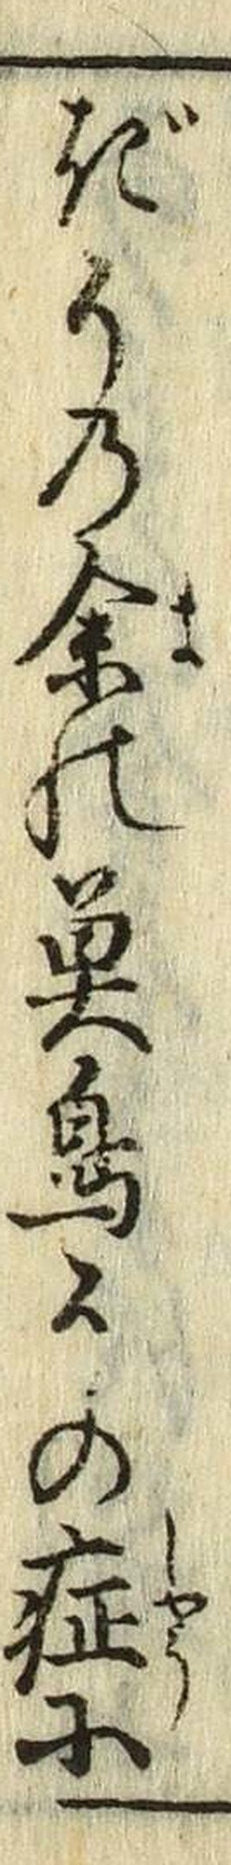ぎその余の魚鳥その症に
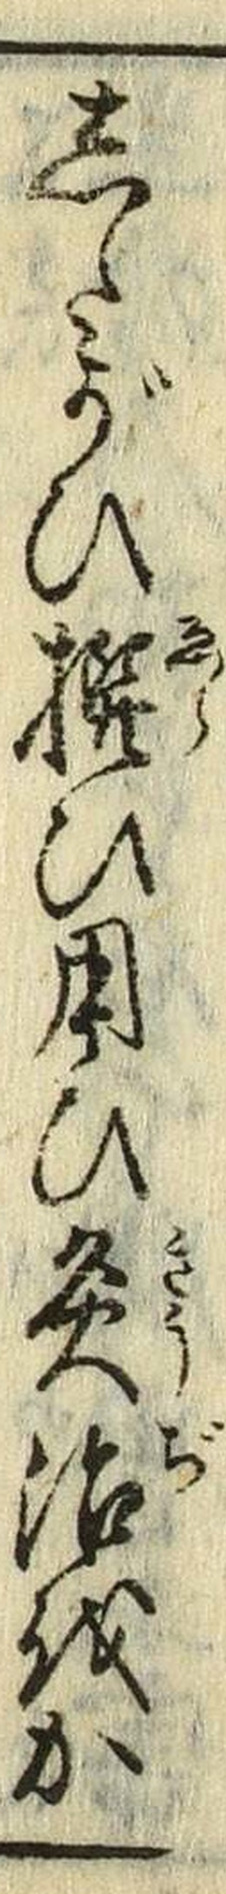したがひ撰ひ用ひ灸治をか
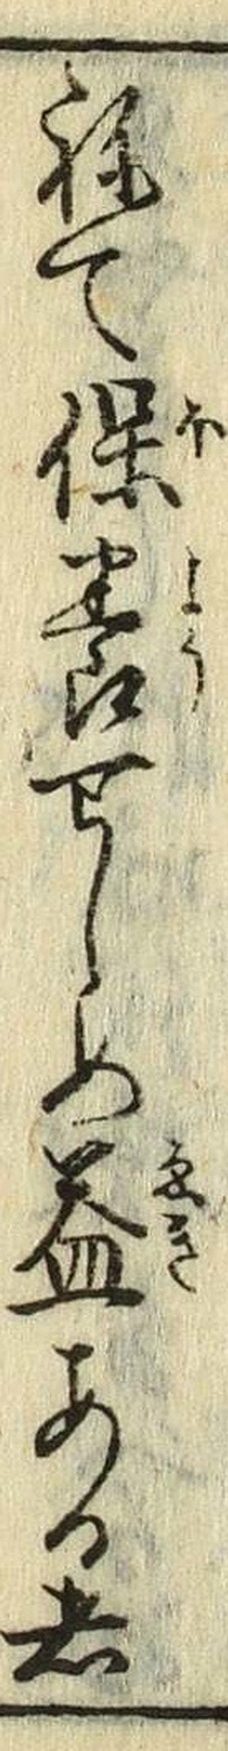ねて保養せしめ益ある者
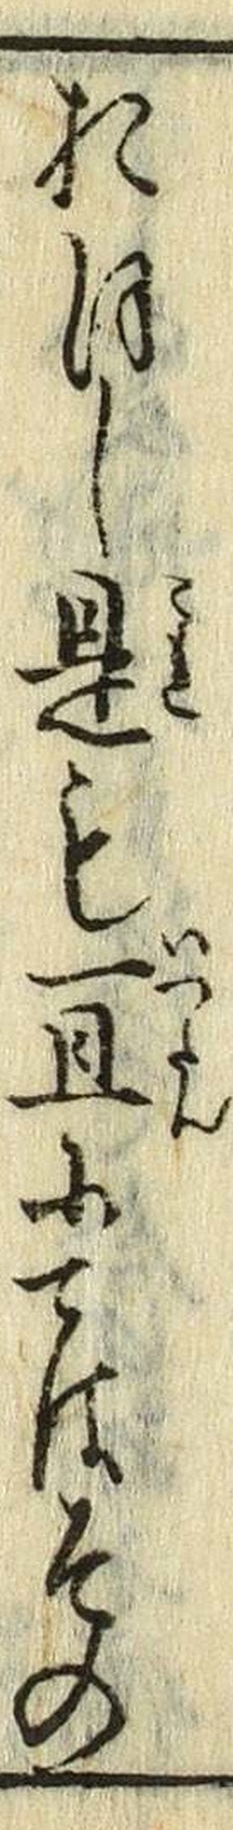おほし是も一旦にてはその
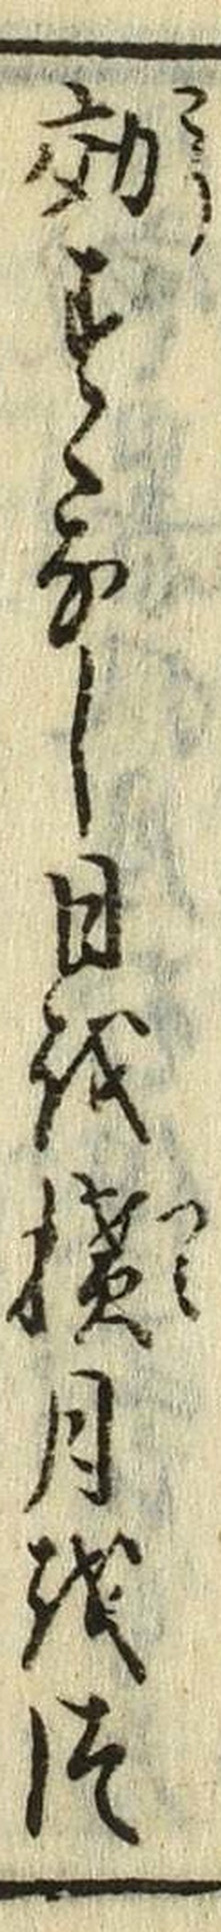効すくなし日を積月をつ
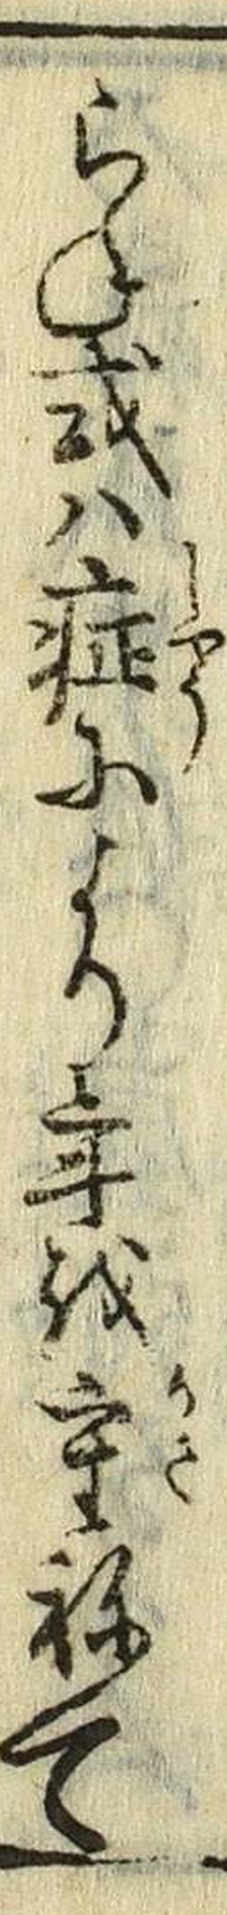らね或は症により年を重ねて
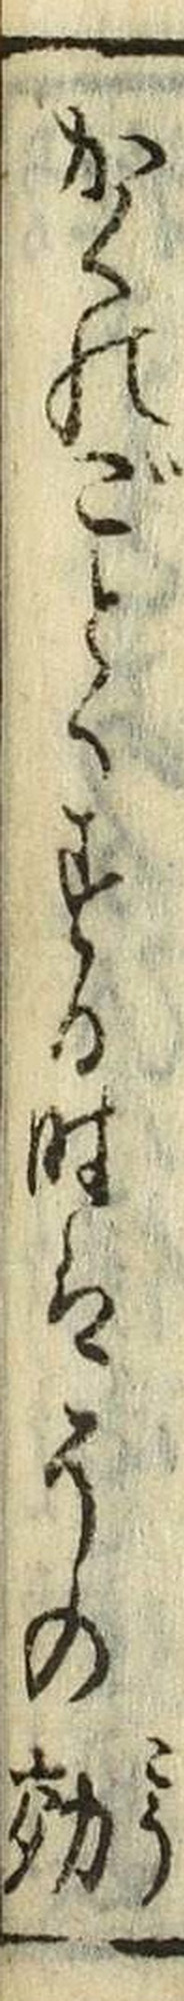かくのごとくする時はその効
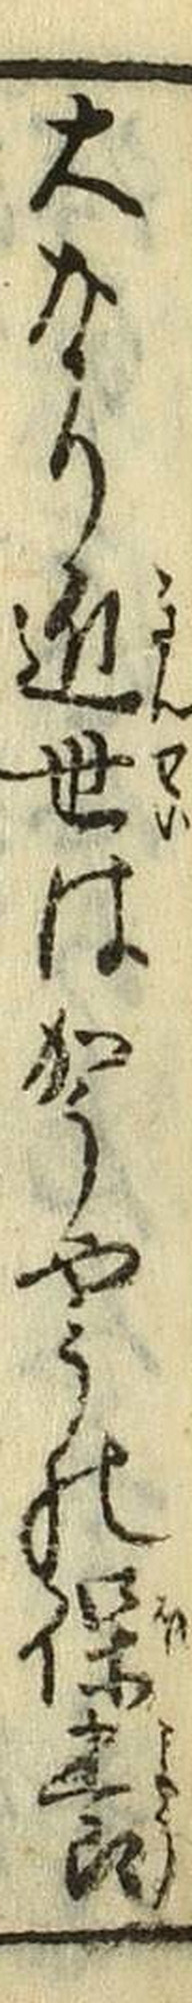大なり近世はかうやうの保養
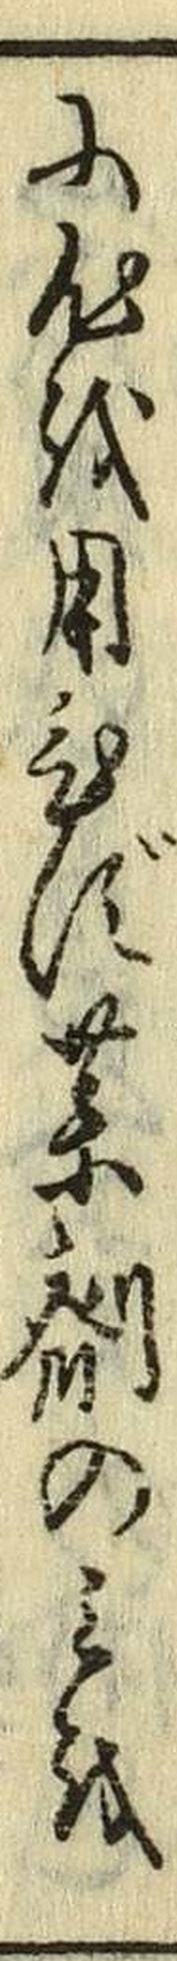に心を用ひず薬剤のみを
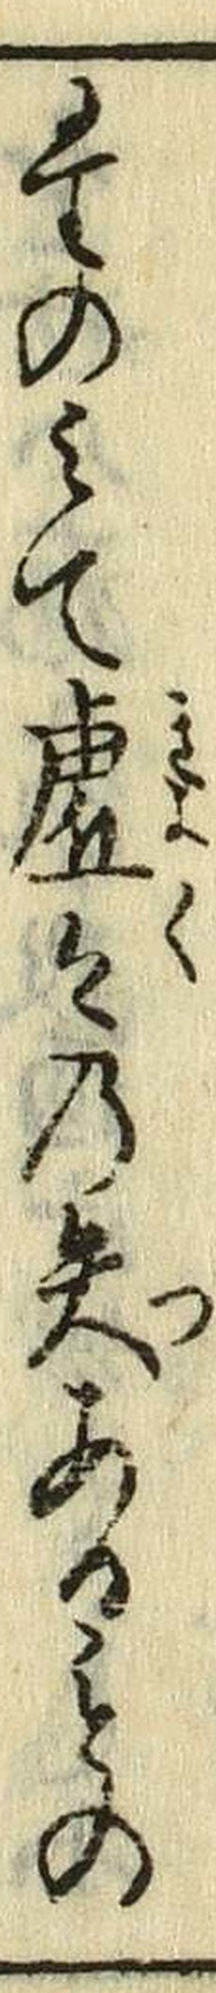たのみて虚々の失あるもの
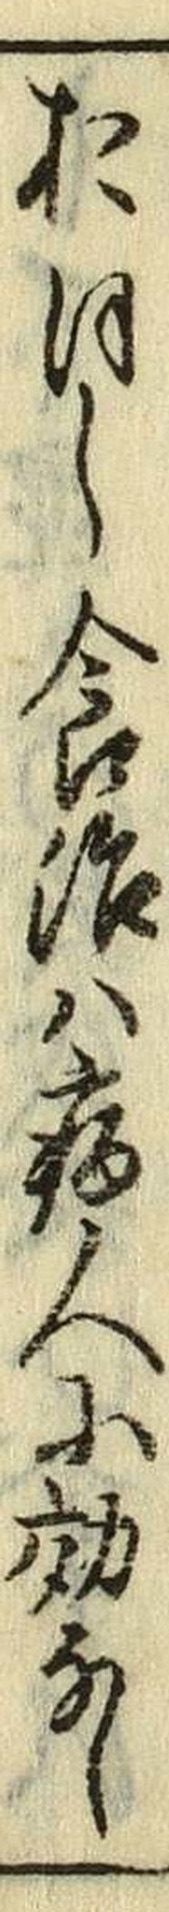おほし食治は病人に効なし
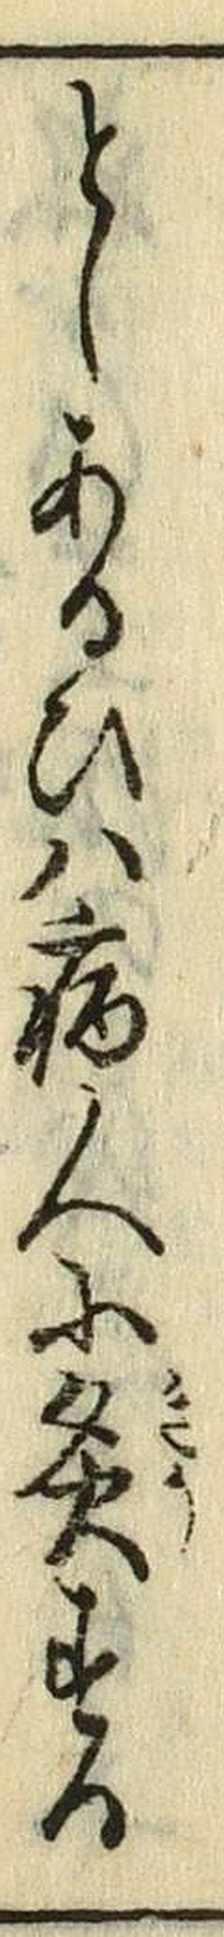としあるひは病人に灸する
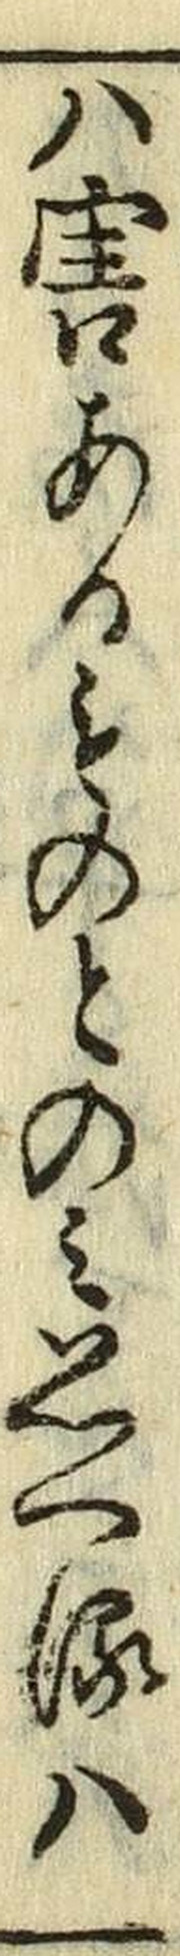は害あるものとのみ思へるは
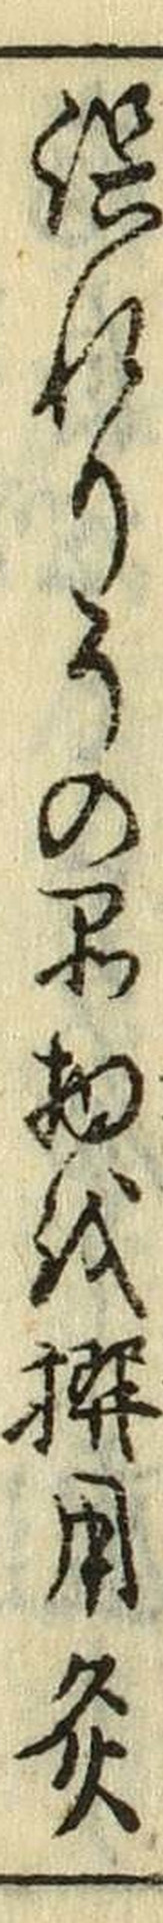誤れりその品物を撰用灸
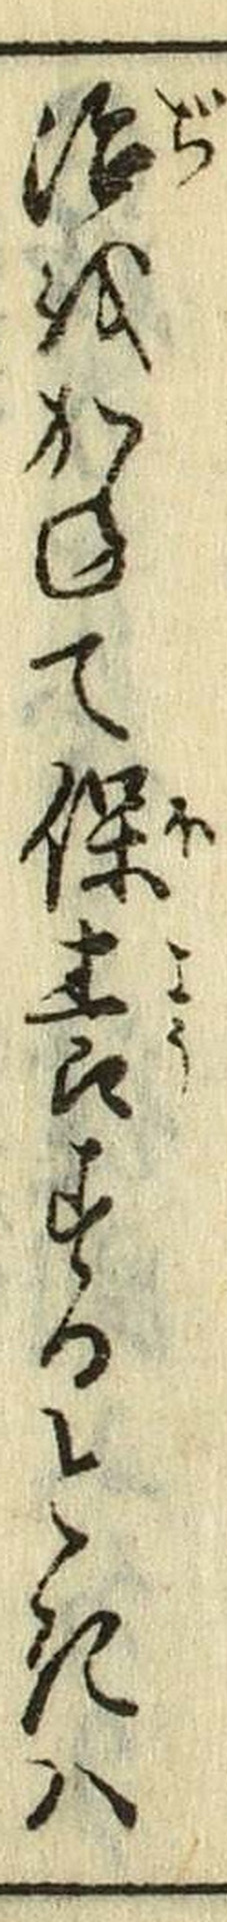治をかねて保養するときは
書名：居家養生記
